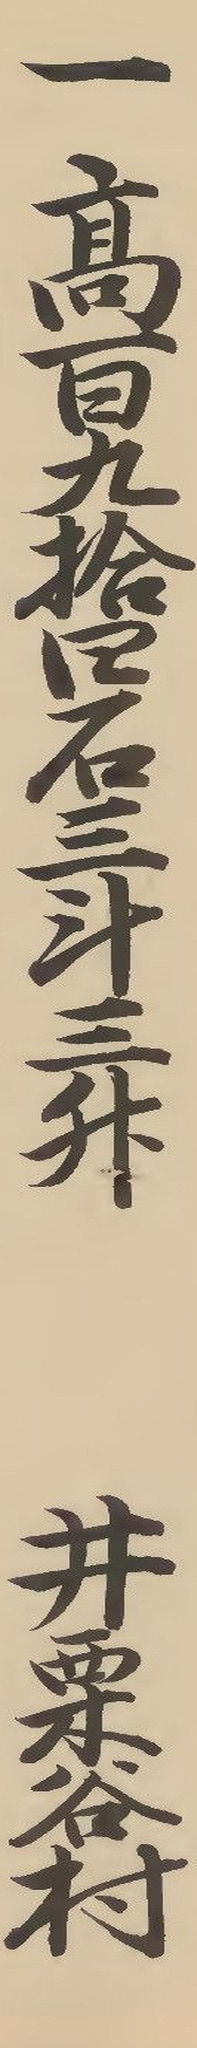一高百九拾四石三斗三升井栗谷村
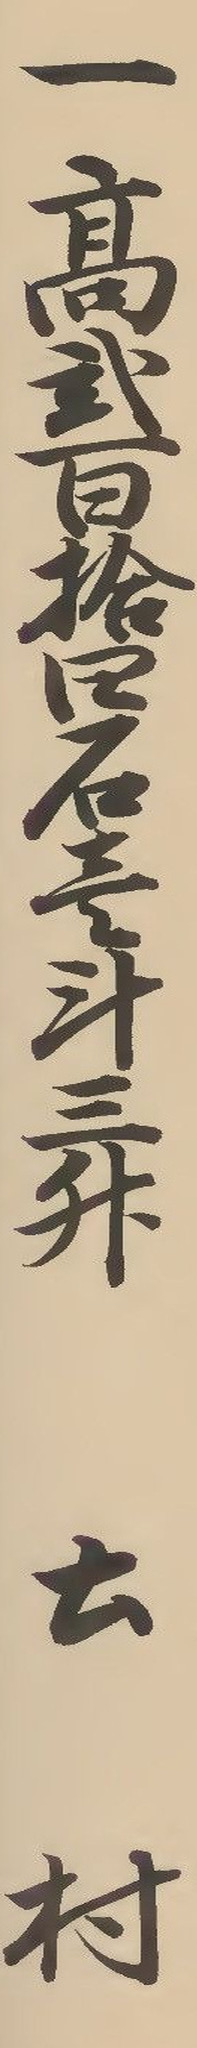一高弐百拾四石壱斗三升土村
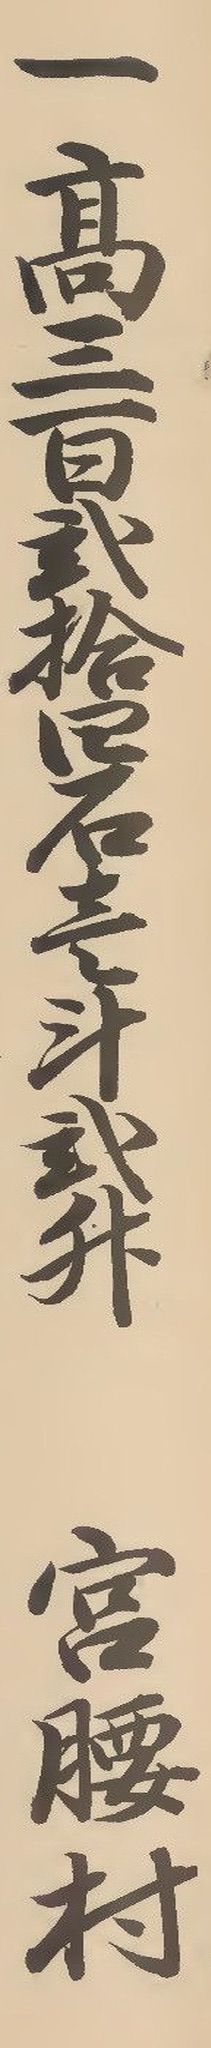一高三百弐拾四石壱斗弐升宮腰村
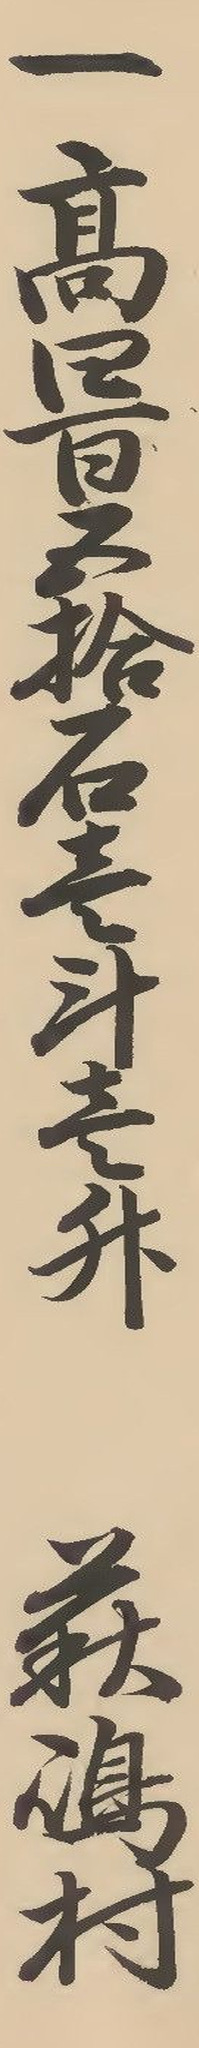一高四百五拾石壱斗壱升萩島村
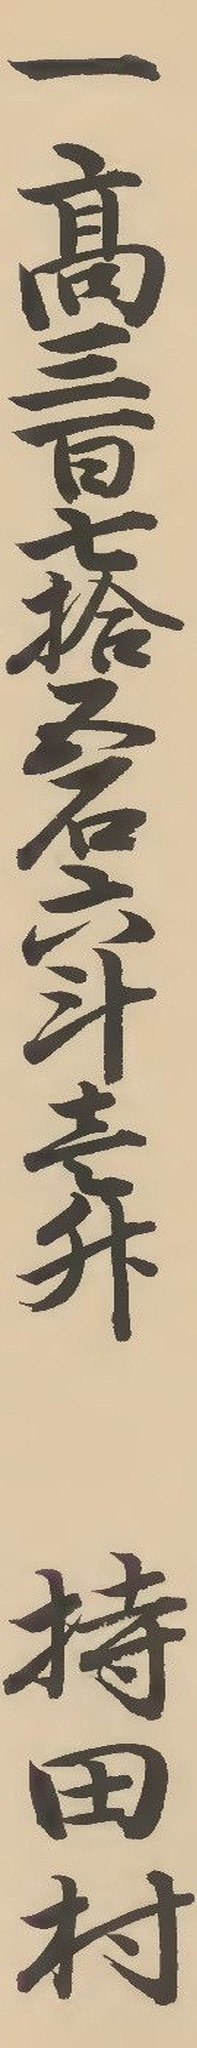一高三百七拾五石六斗壱升持田村
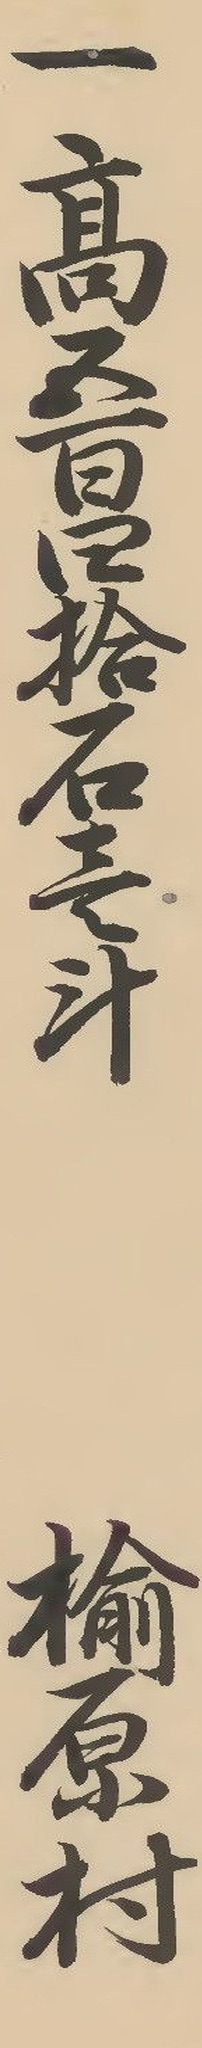一高五百四拾石壱斗楡原村

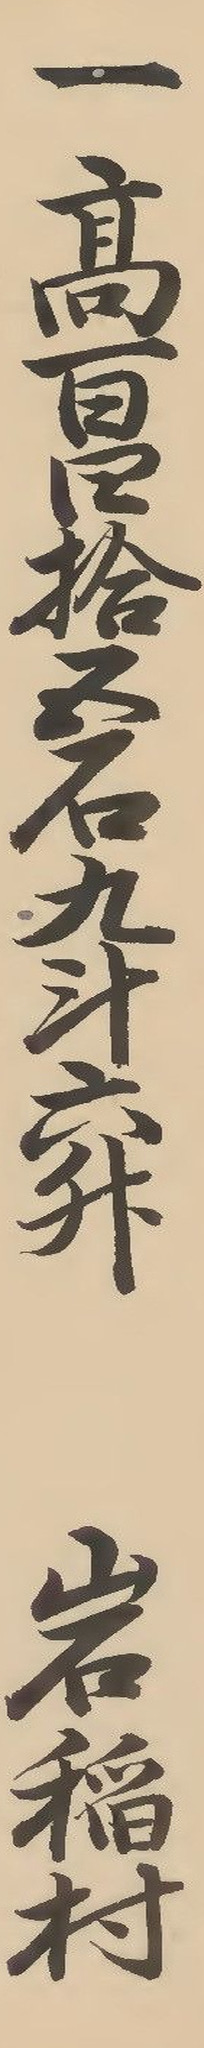一高百四拾五石九斗六升岩稲村
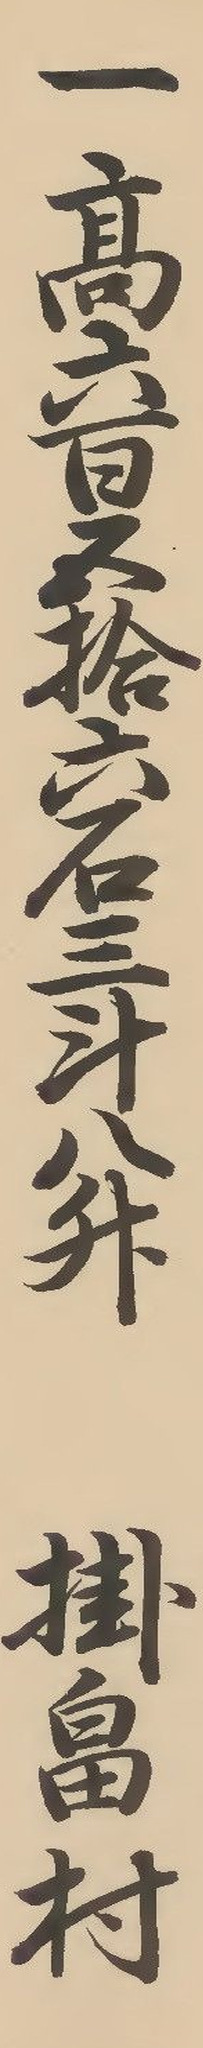一高六百五拾六石三斗八升掛畠村
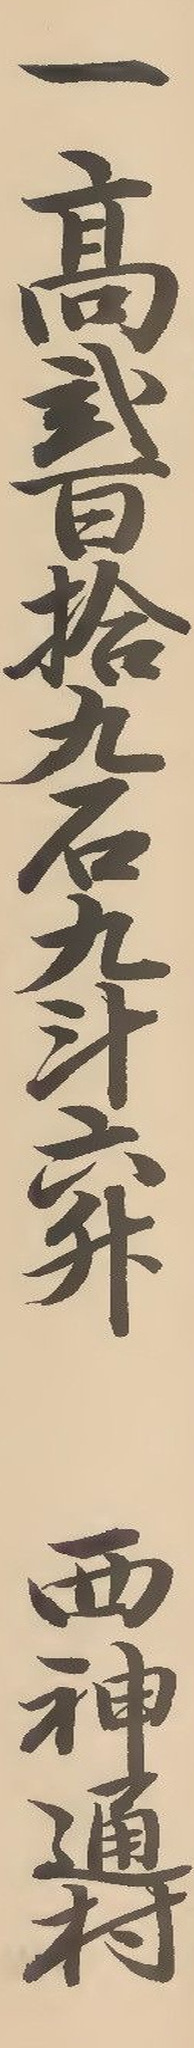一高弐百拾九石九斗六升西神通村
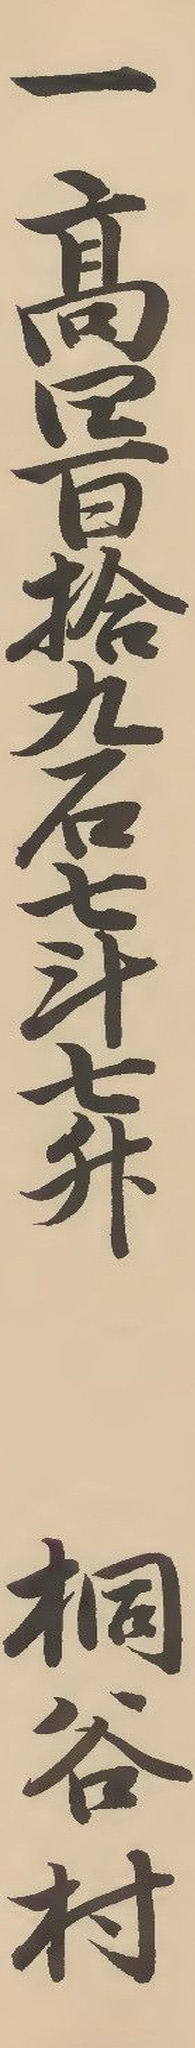一高四百拾九石七斗七升桐谷村
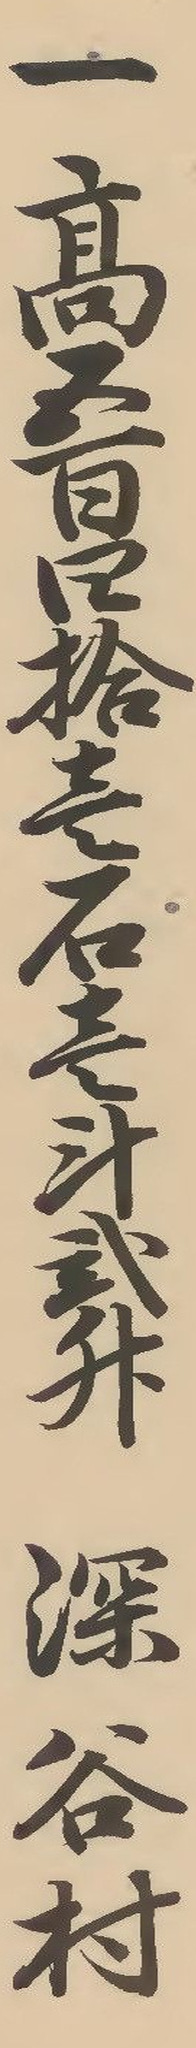一高五百四拾壱石壱斗弐升深谷村

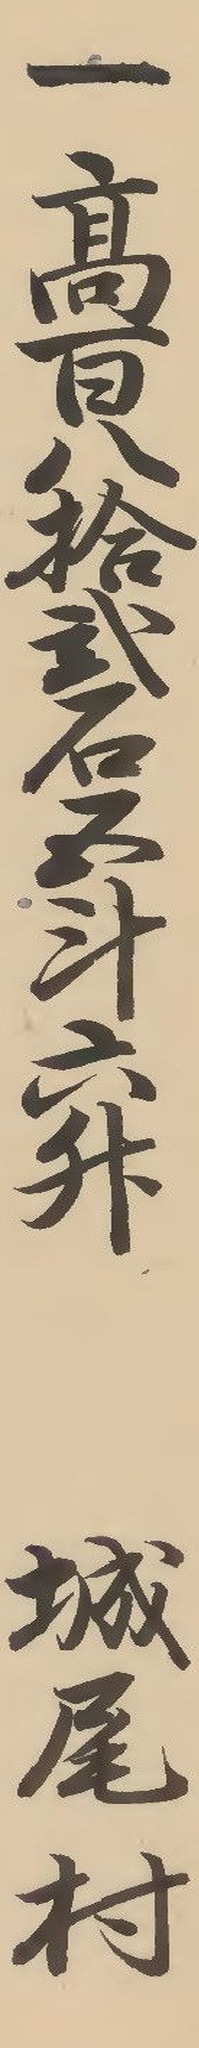一高百八拾弐石五斗六升城尾村
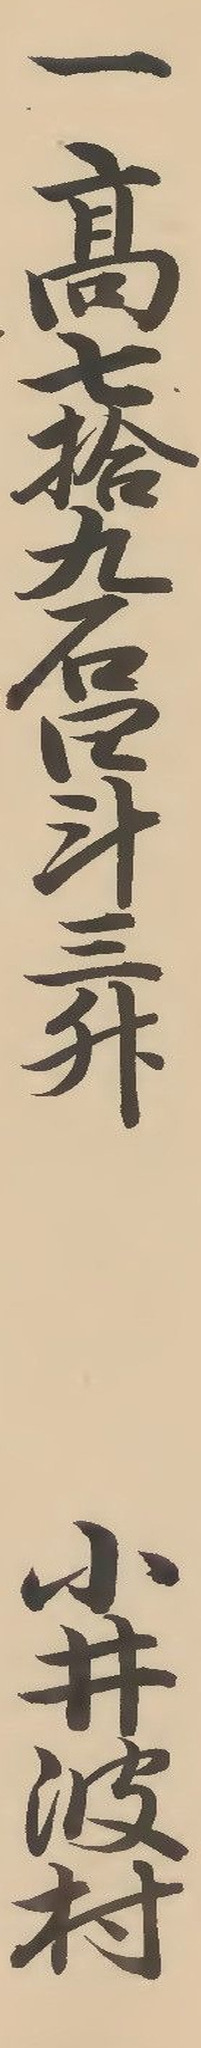一高七拾九石四斗三升小井波村
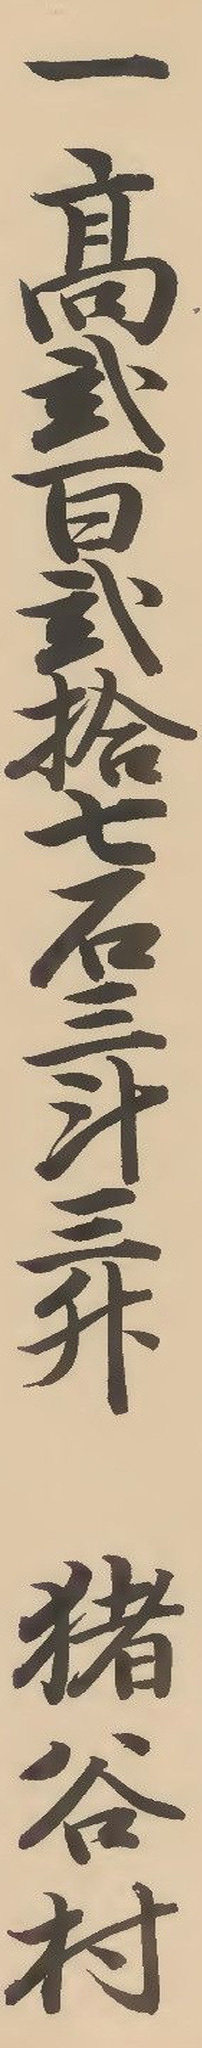一高弐百弐拾七石三斗三升猪谷村
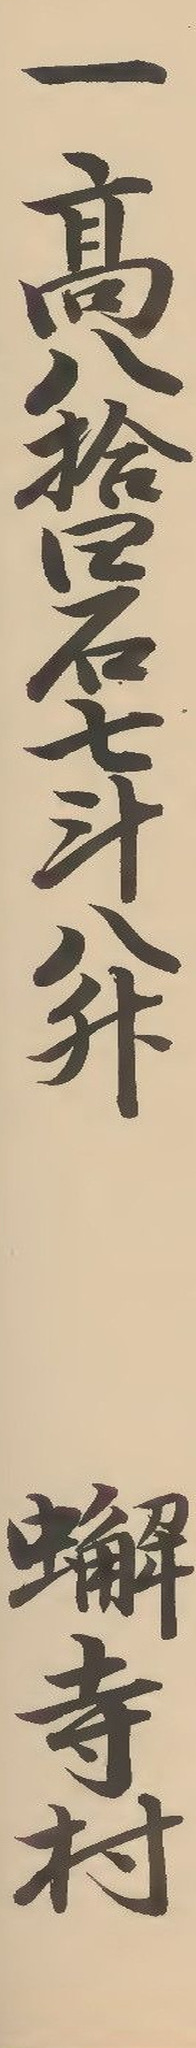一高八拾四石七斗八升蠏寺村
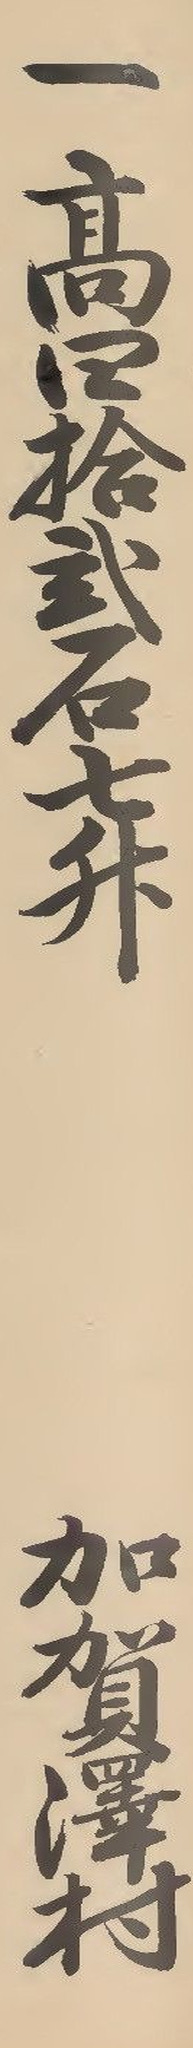一高四拾弐石七升加賀沢村
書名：越中国郷帳
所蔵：国立公文書館 National Archives of Japan
